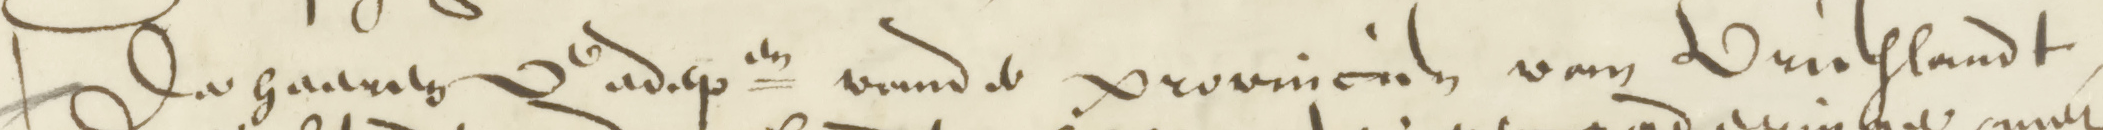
De heeren Gedepen vande provincien van Vrieslandt
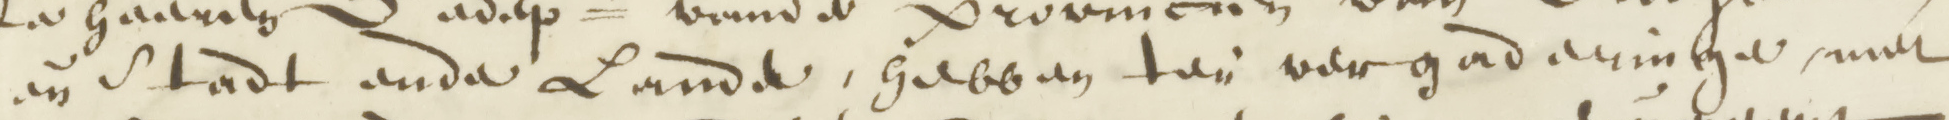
en Stadt ende Lande, hebben ter vergaderinge, met
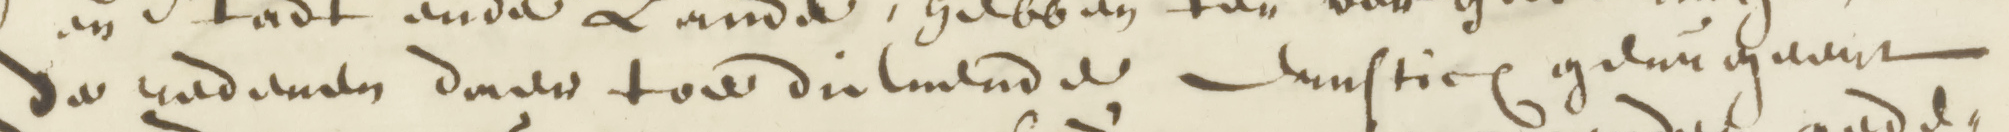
de redenen daer toe dienende ernstich geurgeert
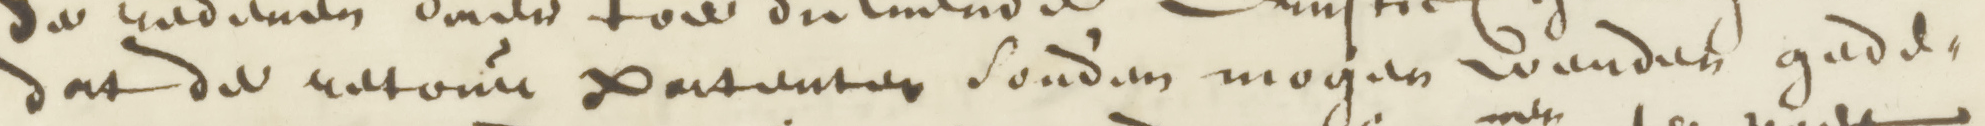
dat de retour patenten souden mogen werden gede„,
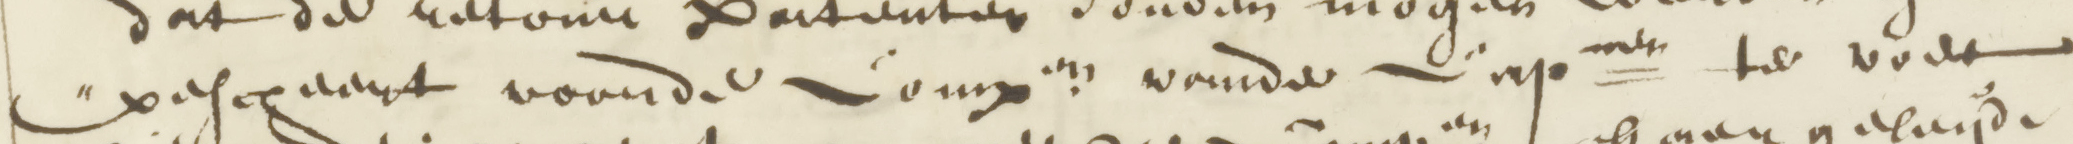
,,pescheert voorde Compen. vande Capnen te voet
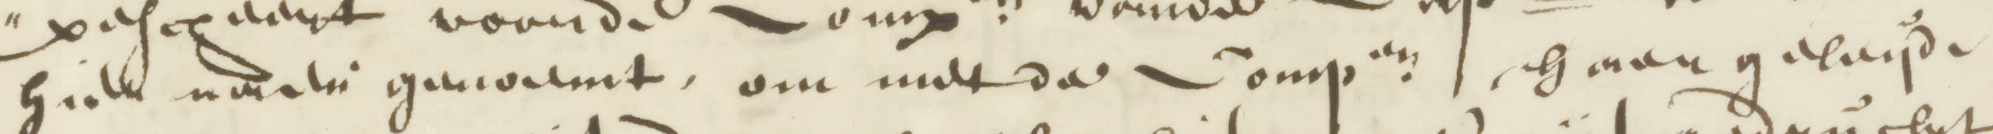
hier naer genoemt, om met de Compen. haer geleijde
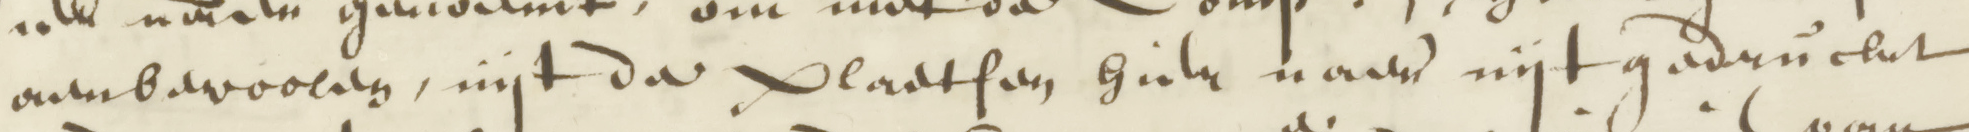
aenbevoolen, uijt de Plaetsen hier naer uijtgedruckt
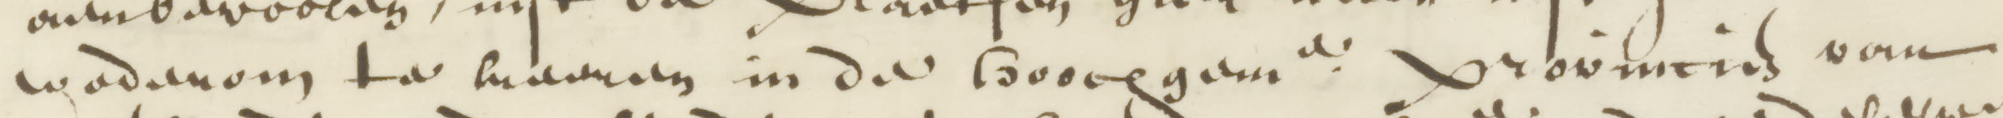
wederom te keeren in de hoochgeme. Provincien van
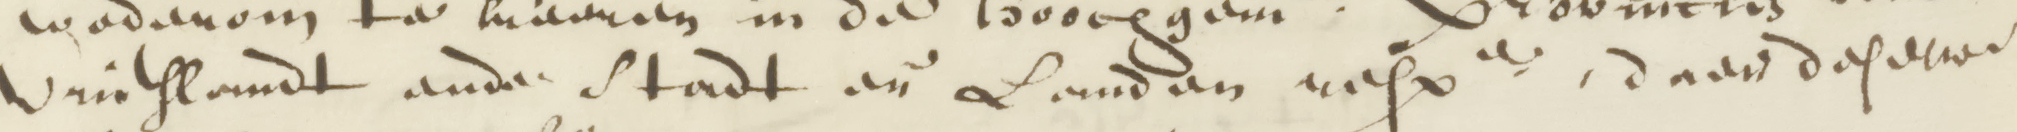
Vrieslandt ende Stadt en Landen respe., daer deselve
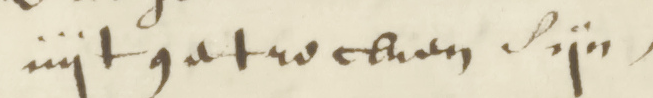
uijt getrocken sijn.
